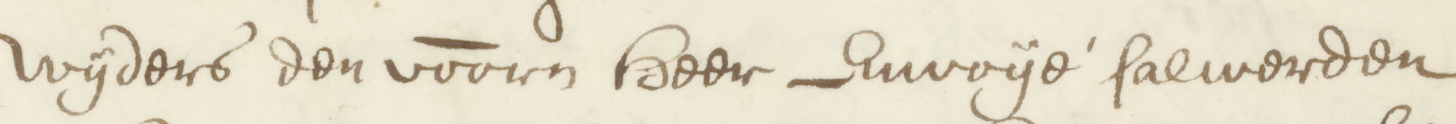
wijders den voorn heer Envoijé sal werden
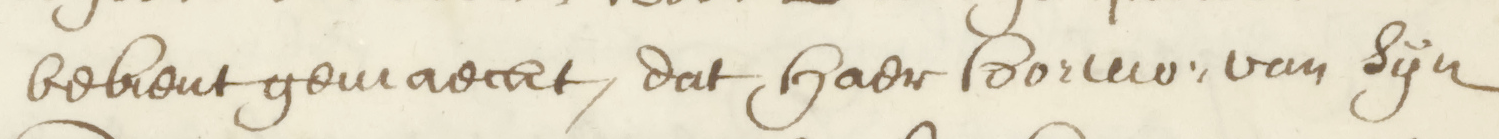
bekent gemaeckt, dat haer ho:mo: van sijn
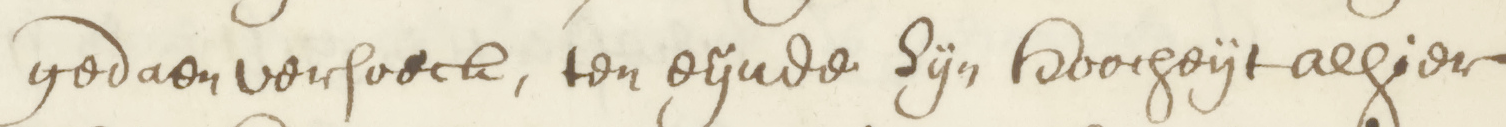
gedaen versoeck, ten eijnde sijn hoocheijt alhier
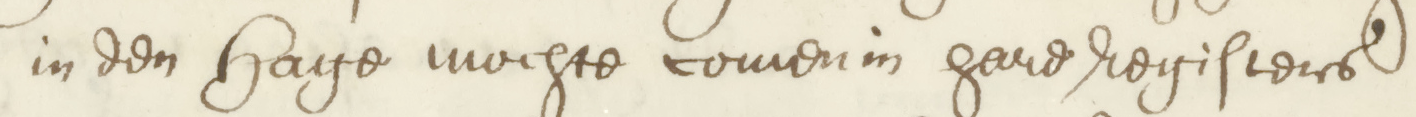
in den hage mochte comen in hare registers
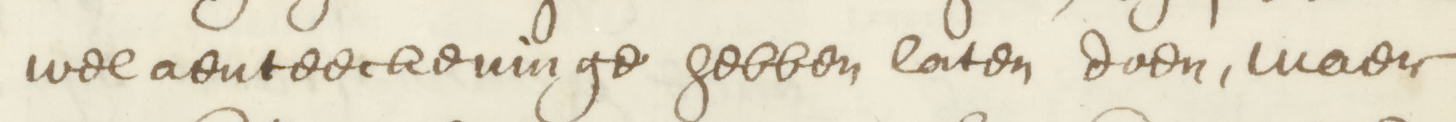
wel aenteeckeninge hebben laten doen, maer
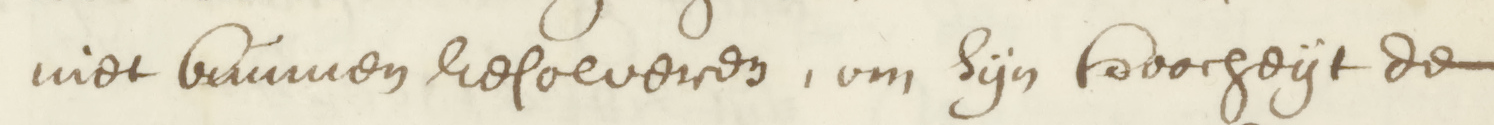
niet kunnen resolveren, om sijn hoocheijt de
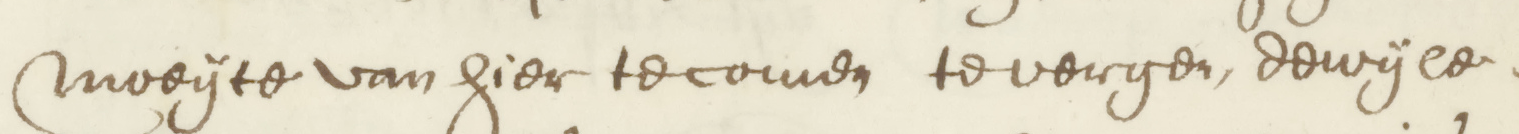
moeijte van hier te comen te vergen, dewijle
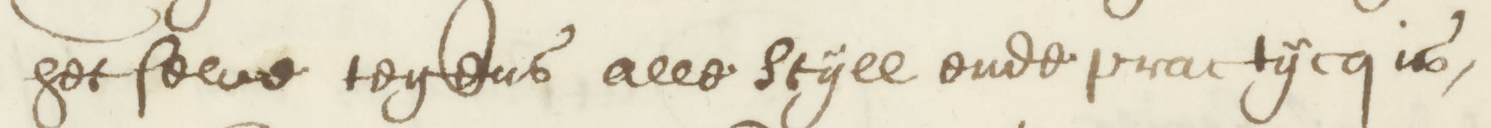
het selve tegens alle stijll ende practijcq is,
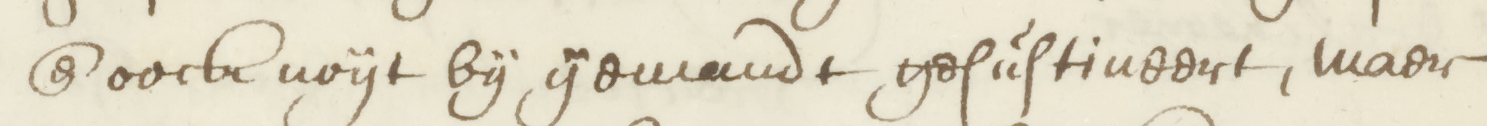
& oock noijt bij ijemandt gesustineert, maer
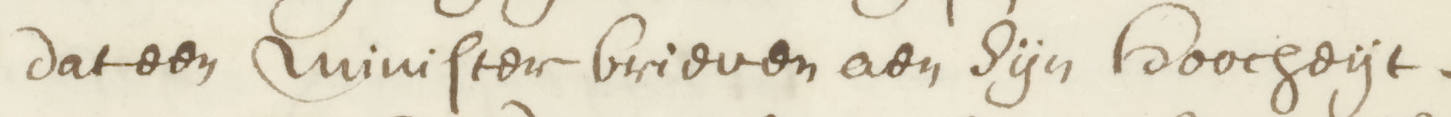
dat een minister brieven aen sijn hoocheijt
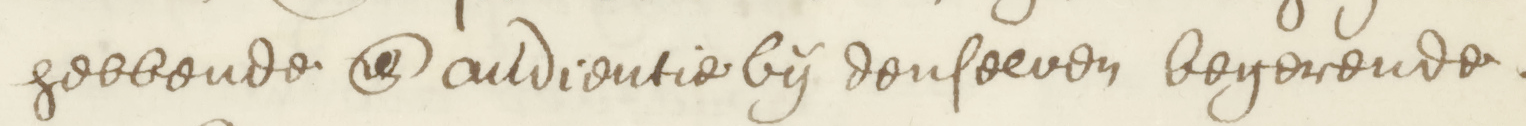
hebbende & audientie bij denselven begerende
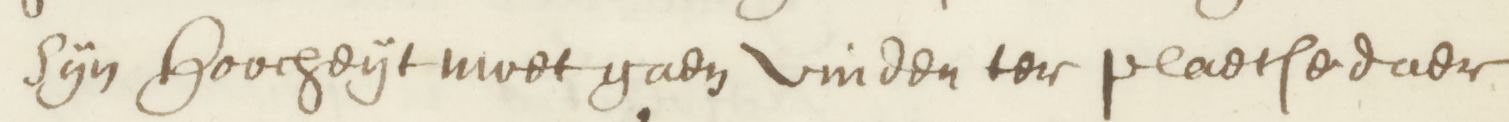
sijn hoocheijt moet gaen vinden ter plaetse daer
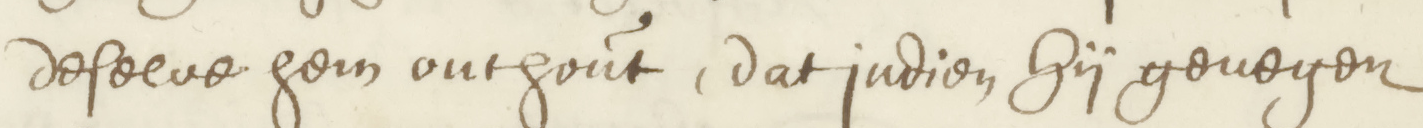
deselve hem onthout, dat indien hij genegen
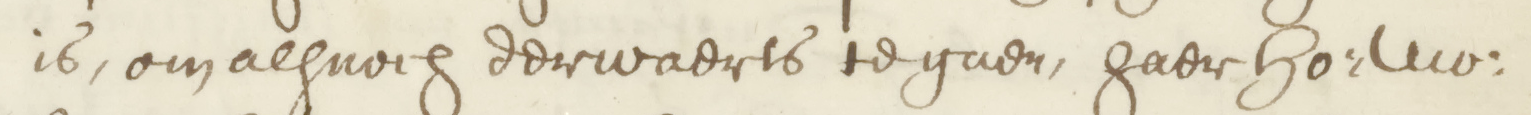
is, om alsnoch derwaerts te gaen, haer ho:mo:
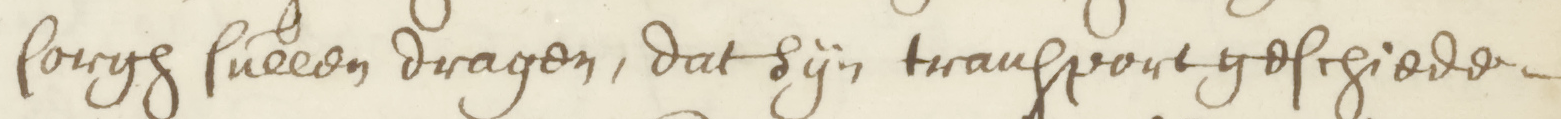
sorgh sullen dragen, dat sijn transport geschiede
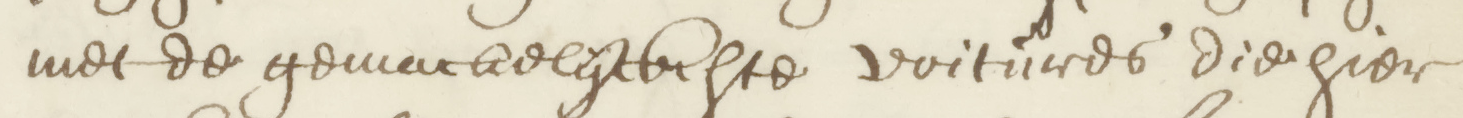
met de gemackelijckste voitures die hier
